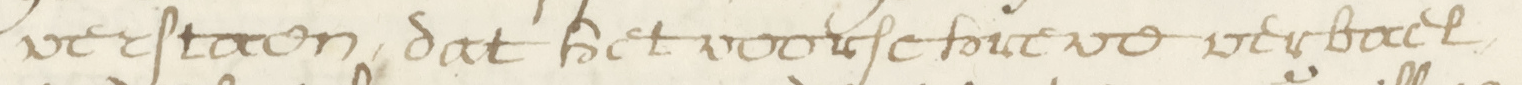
verstaen, dat het voorschreve verbael
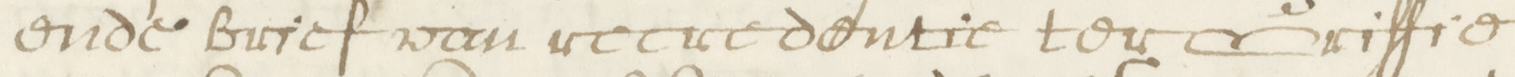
ende brief van recredentie ter Griffie
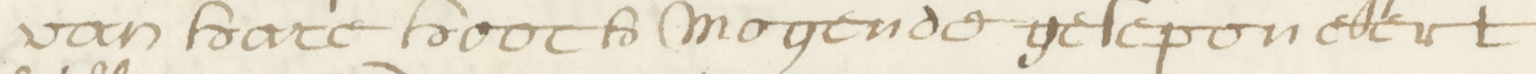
van hare hooch mogende geseponeert
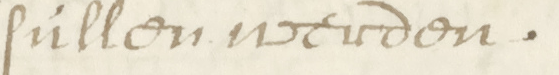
sullen werden.
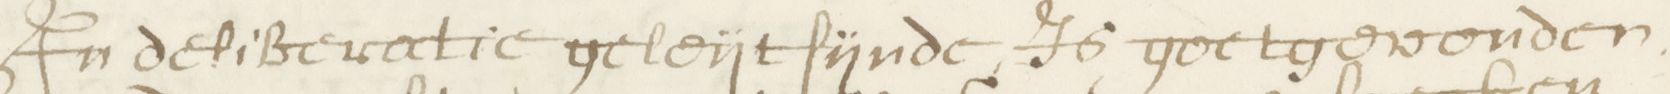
In deliberatie geleijt sijnde, Is goetgevonden
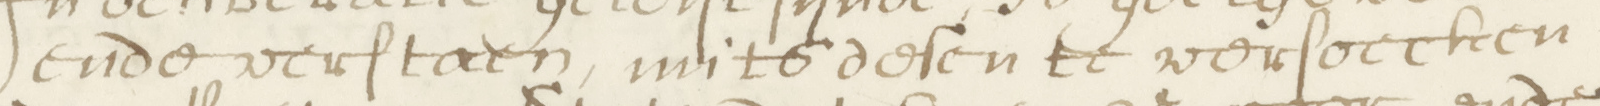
ende verstaen, mits desen te versoecken
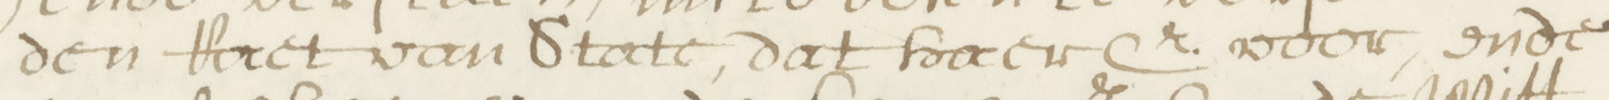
den Raet van State, dat haer E. voor ende
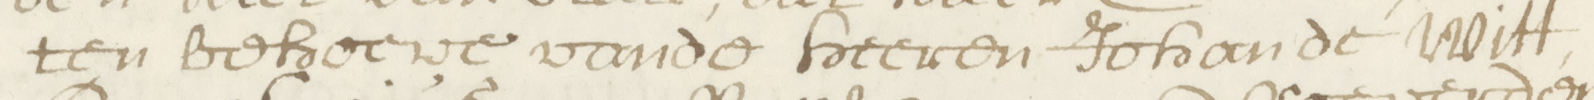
ten behoeve vande heeren Johan de Witt,
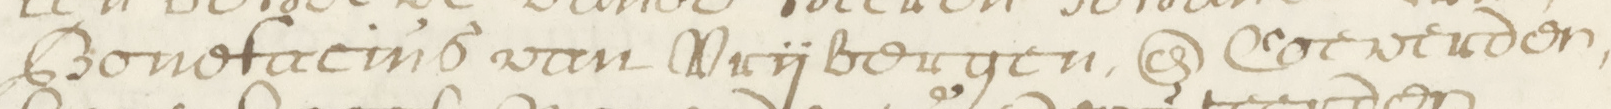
Bonefacius van Vrijbergen, & Coeverden,
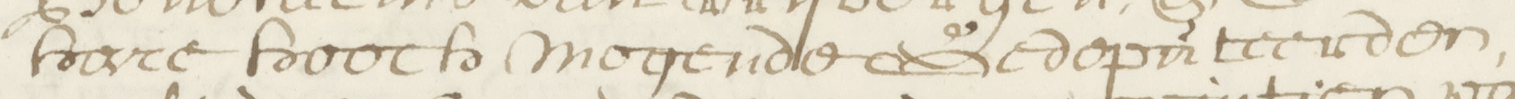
hare hooch mogende Gedeputeerden,
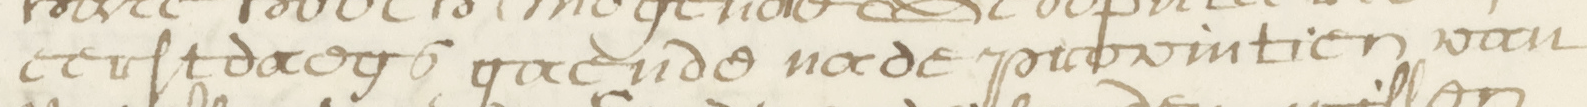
eerstdaegs gaende na de provintien van
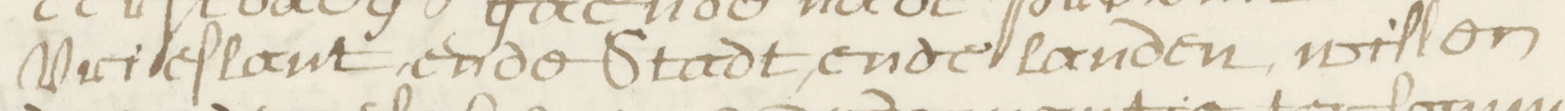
Vrieslant ende Stadt, ende landen, willen
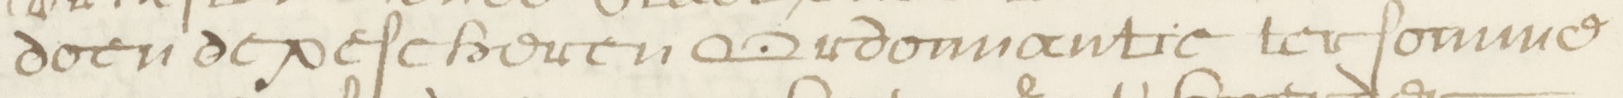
doen depescheren Ordonnantie ter somme
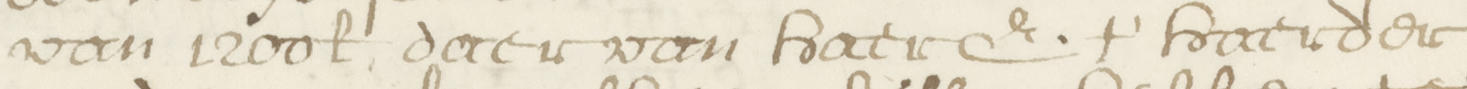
van 1200 L., daer van haer E. t'haerder
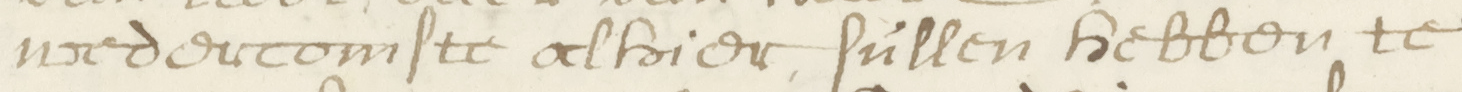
wedercomste alhier sullen hebben te
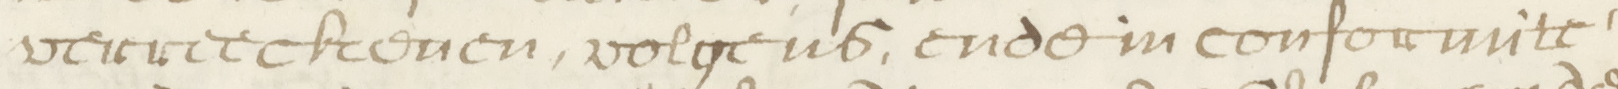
verreeckenen, volgens, ende in conformité
